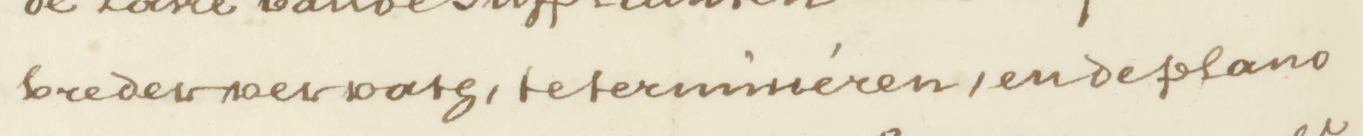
breder vervath, te terminéren en de plano
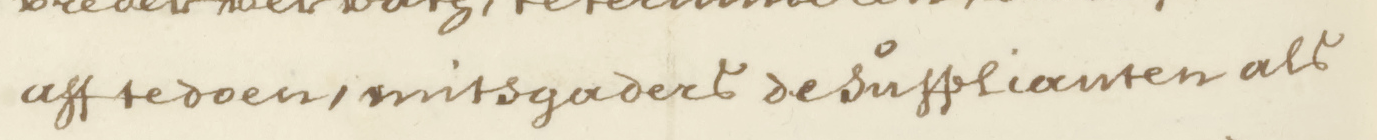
aff te doen, mitsgaders de supplianten als
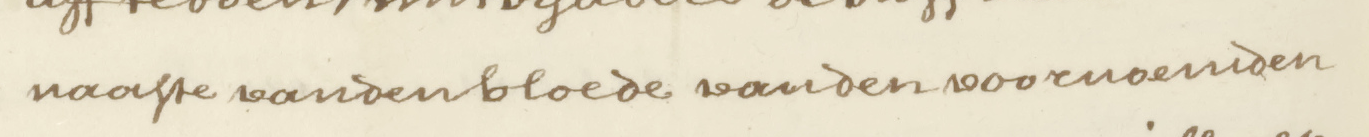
naaste vanden bloede vanden voornoemden
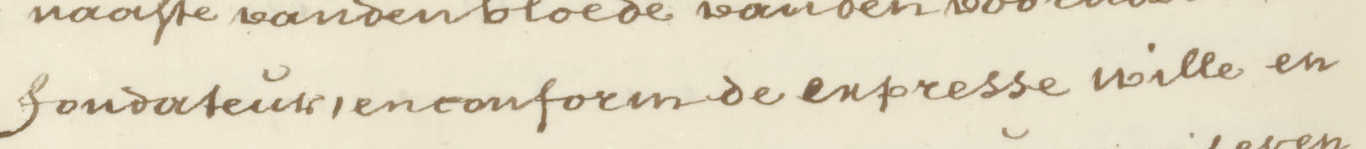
fondateur, en conform de expresse wille en
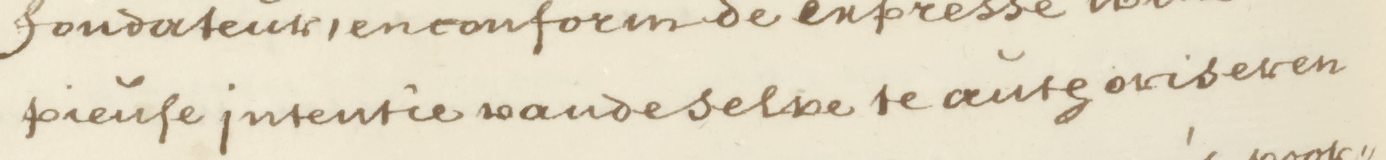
pieuse intentie vande selve te authoriseren
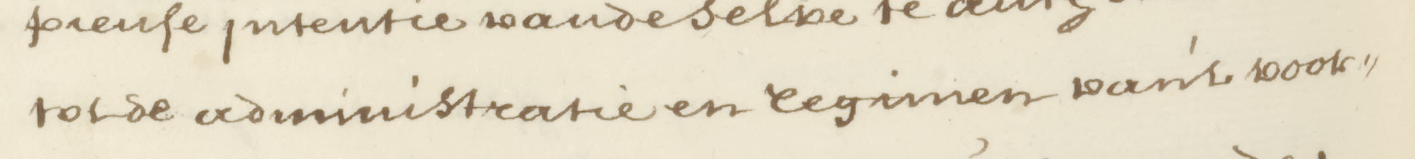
tot de administratie en regimen van 't voor„
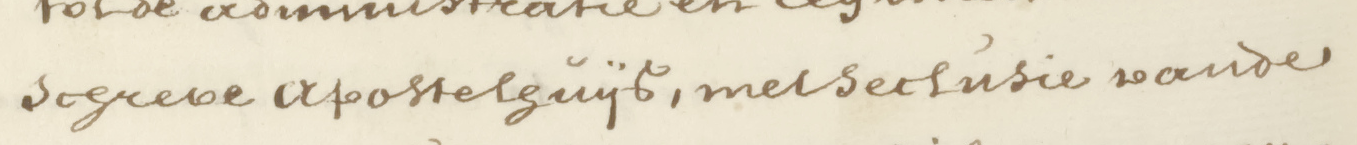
schreve Apostelhuijs, met seclusie vande
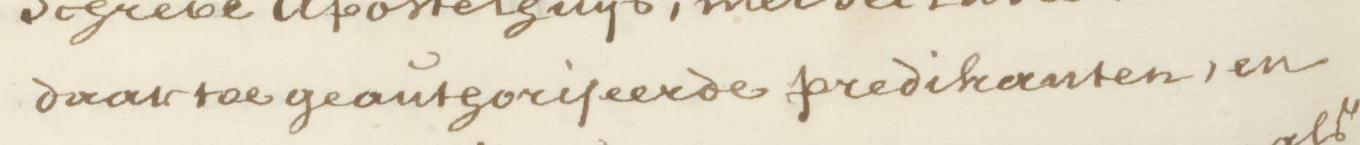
daar toe geauthoriseerde predikanten, en
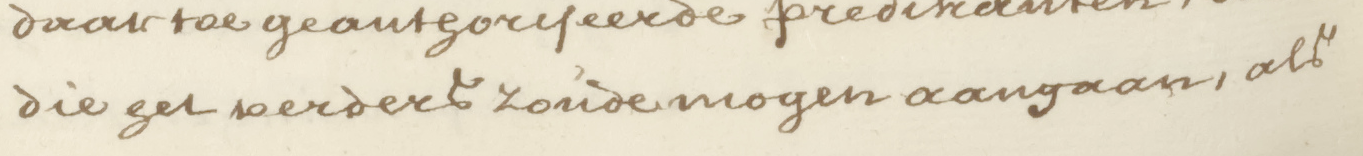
die het verders zoude mogen aangaan, als
